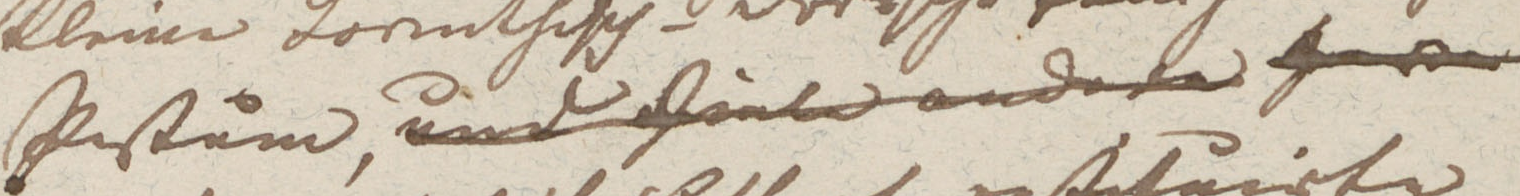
Pestum, und Viele andere ferne
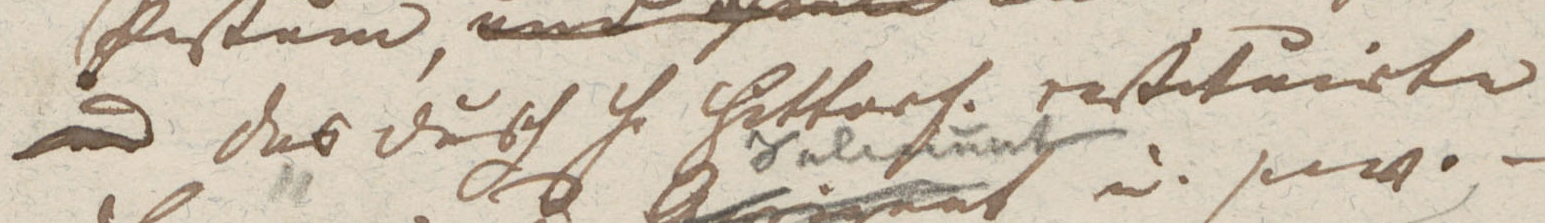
und das dasurch H. Hittorf. restituirte
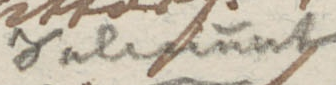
%dem somit wahrscheinlich
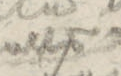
den bemalten
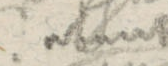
Dorischer und
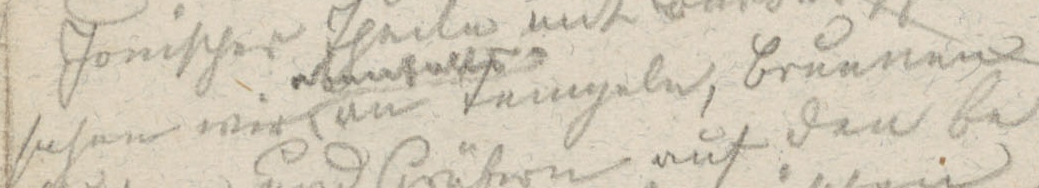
sehen wir ebenfalls an Tempeln, Brunnen
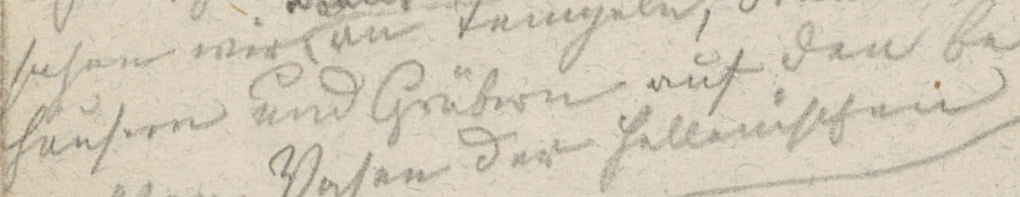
Häusern und Gräbern auf den be
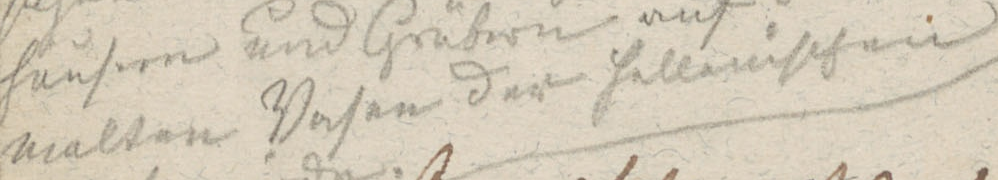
malten Vasen der Hellenischen
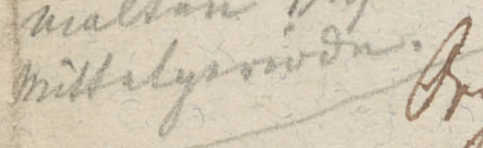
Mittelperiode.
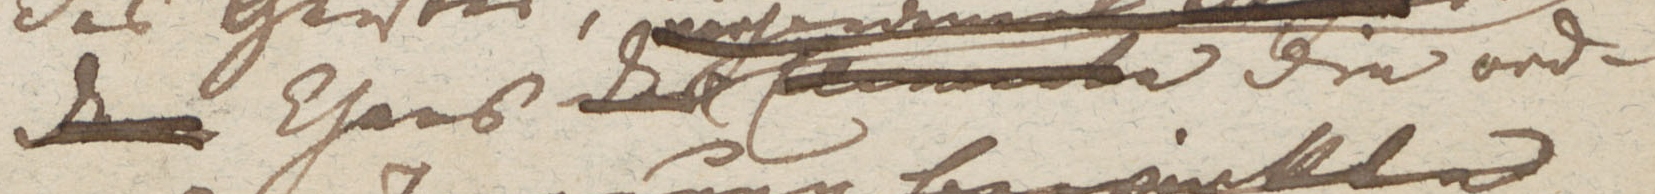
in diesem dem Chaos des vorherdem all das Elemente die ord-
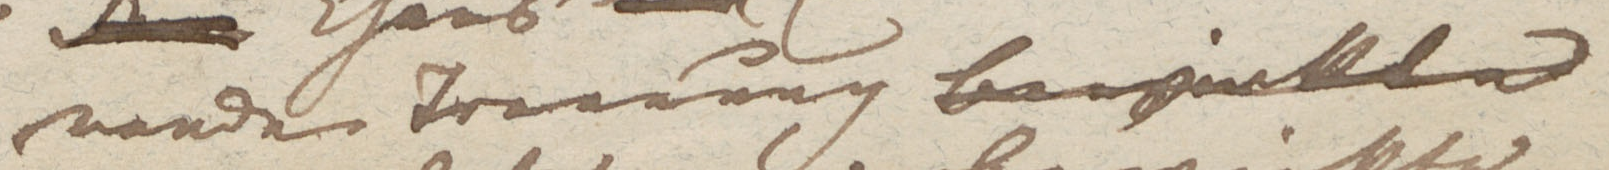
nenden Trennung bewirkte
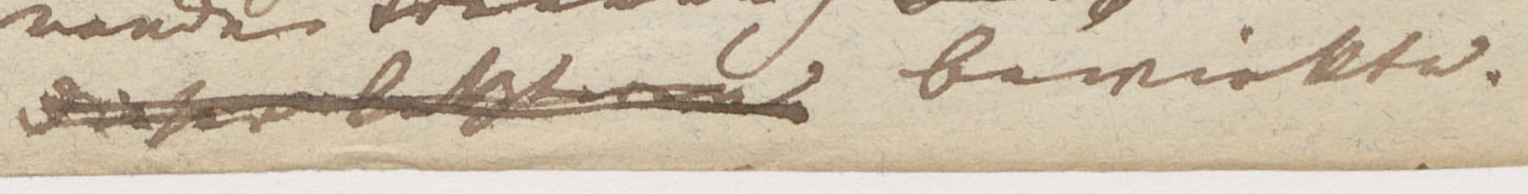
dieser letzteren bewirkte.
